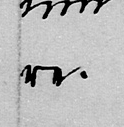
er
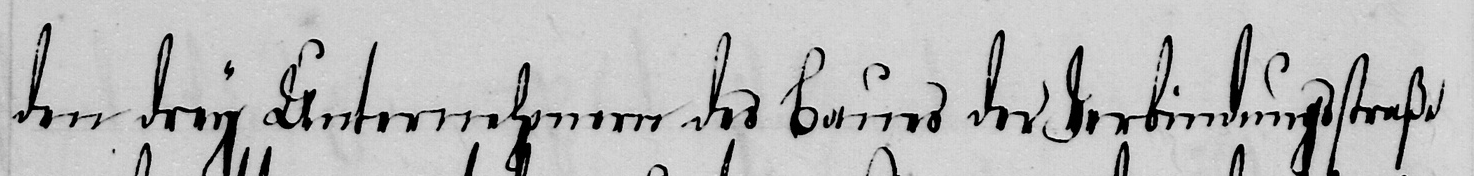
den drey Unternehmern des Baues der Verbindungsstra¬
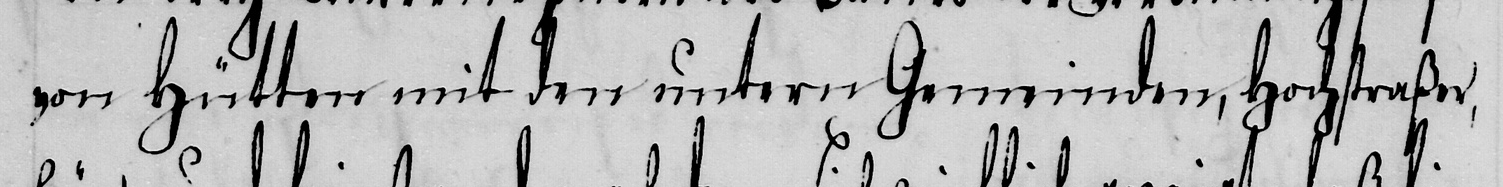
von Hütten mit den untern Gemeinden, Hochstraße¬
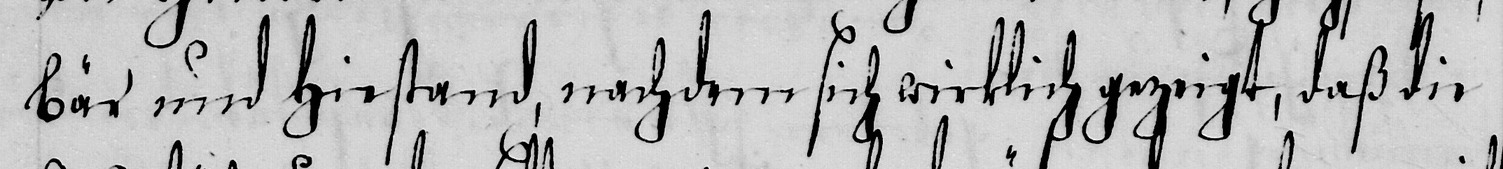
Bär und Hiestand, nachdem sich wirklich gezeigt, daß die
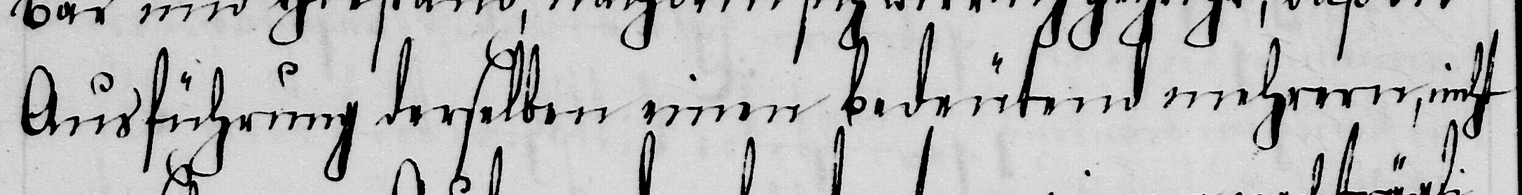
Ausführung derselben einen bedeutend mehrern, nicht
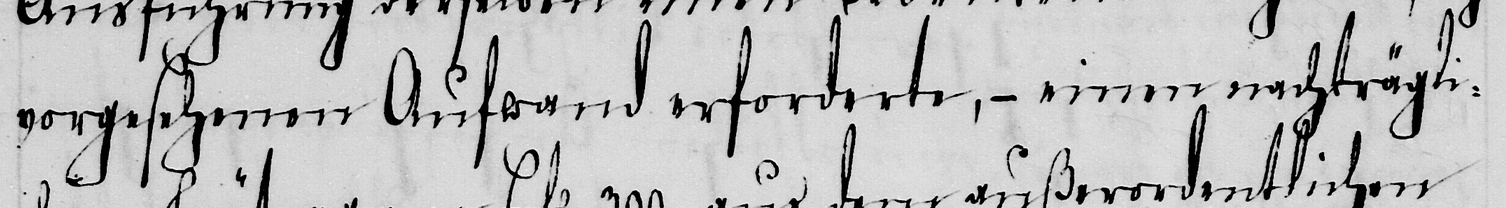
vorgesehenen Aufwand erforderte, – einen nachträgli¬
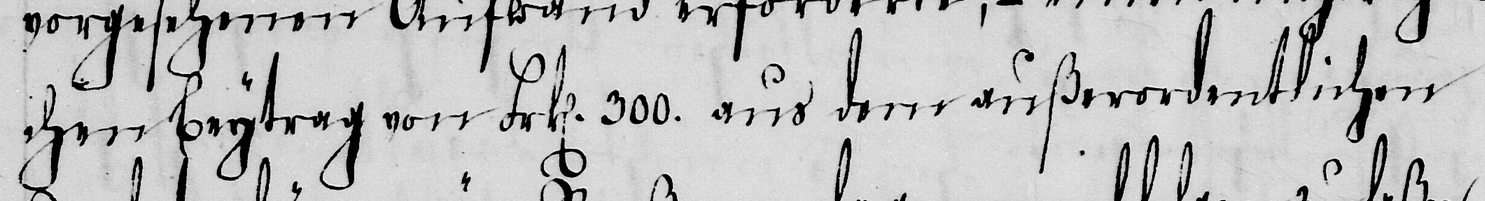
chen Beytrag von Frk[en]. 300. aus dem außerordentlichen
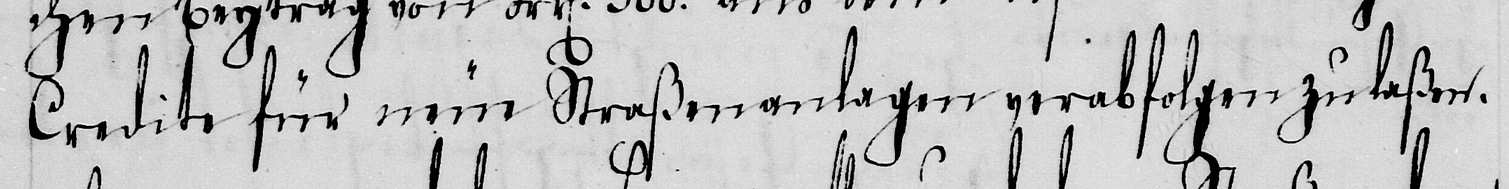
Credite für neue Straßenanlagen verabfolgen zu laßen.
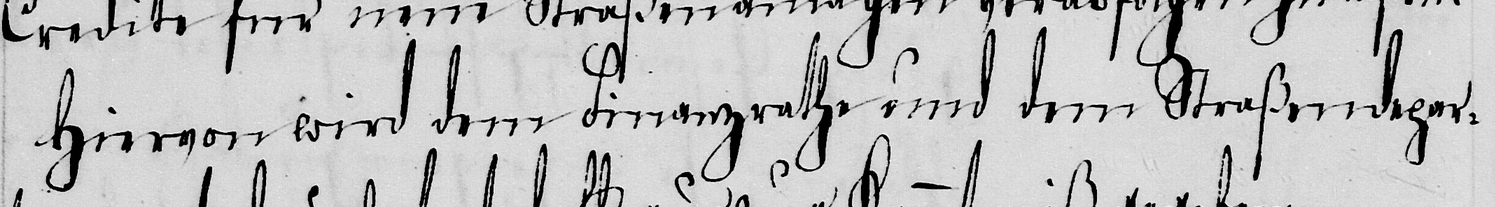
Hiervon wird dem Finanzrathe und dem Straßendepar¬
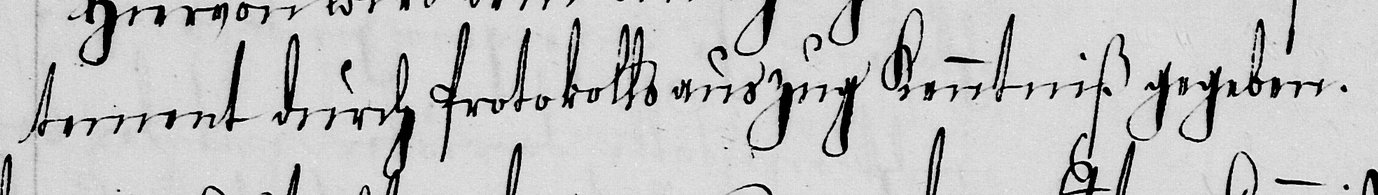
tement durch Protokollsauszug Kenntniß gegeben.
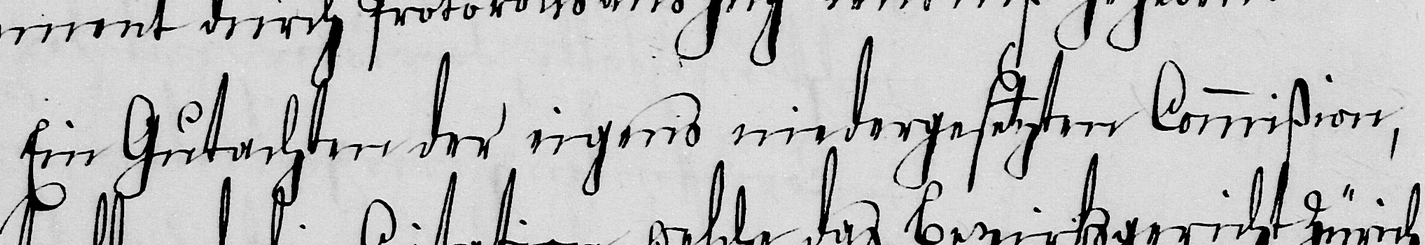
Ein Gutachten der eigens niedergesetzten Commißion,
